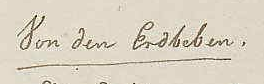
Von den Erdbeben.
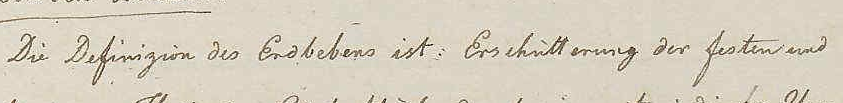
Die Definizion des Erdbebens ist: Erschütterung der festen und
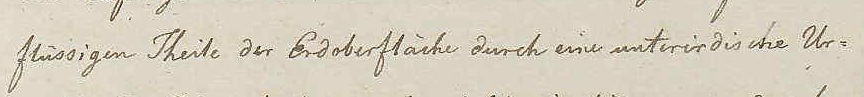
flüssigen Theile der Erdoberfläche durch eine unterirdische Ur-
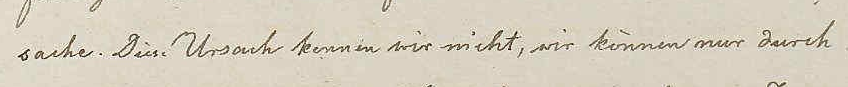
sache. Diese Ursach kennen wir nicht, wir können nur durch
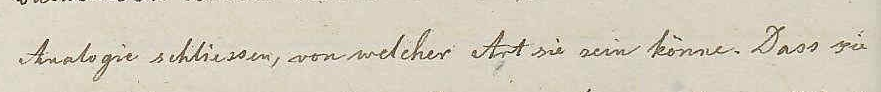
Analogie schliessen, von welcher Art sie sein könne. Dass sie
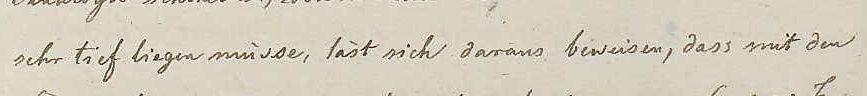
sehr tief liegen müsse, läst sich daraus beweisen, dass mit den
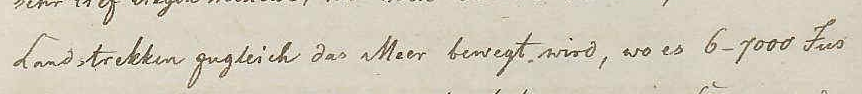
Landstrekken zugleich das Meer bewegt wird, wo es 6–7000 Fus
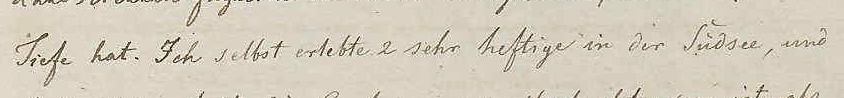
Tiefe hat. Ich selbst erlebte 2 sehr heftige in der Südsee, und
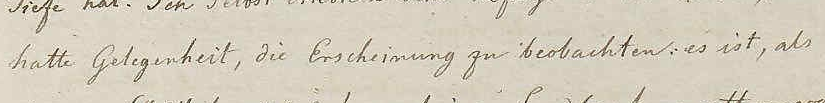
hatte Gelegenheit, die Erscheinung zu beobachten: es ist, als
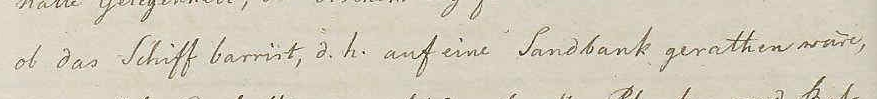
ob das Schiff barrirt, d. h. auf eine Sandbank gerathen wäre,
